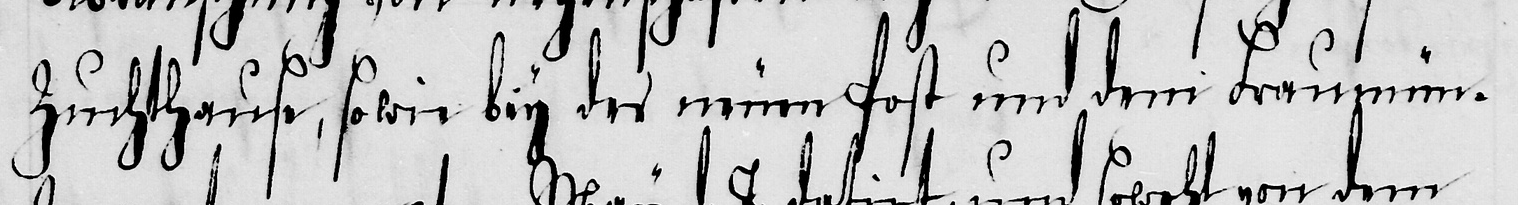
Zuchthause, sowie bey der neuen Post und dem Fraumün¬
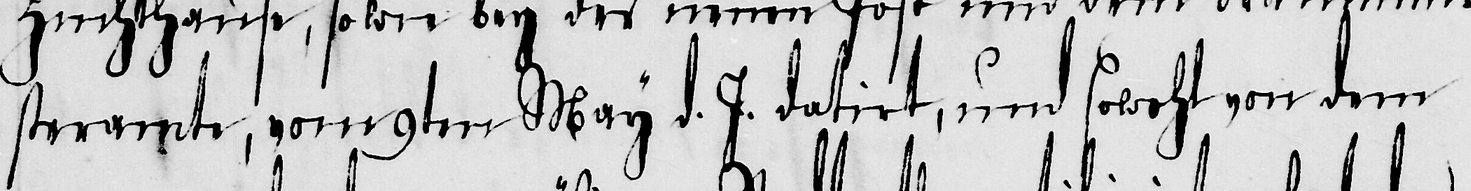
steramte, vom 9ten Mey d. J. datirt, und sowohl von dem
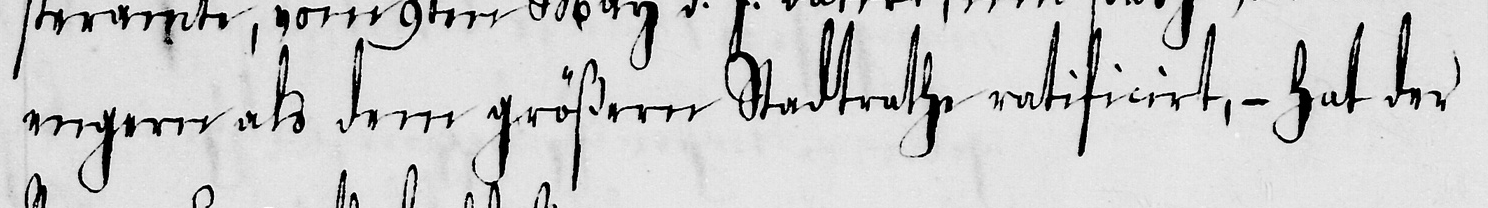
engern als dem größern Stadtrathe ratificirt, – hat der
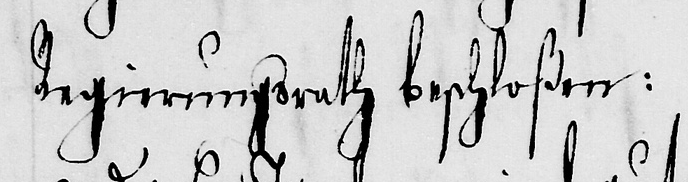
Regierungsrath beschloßen:
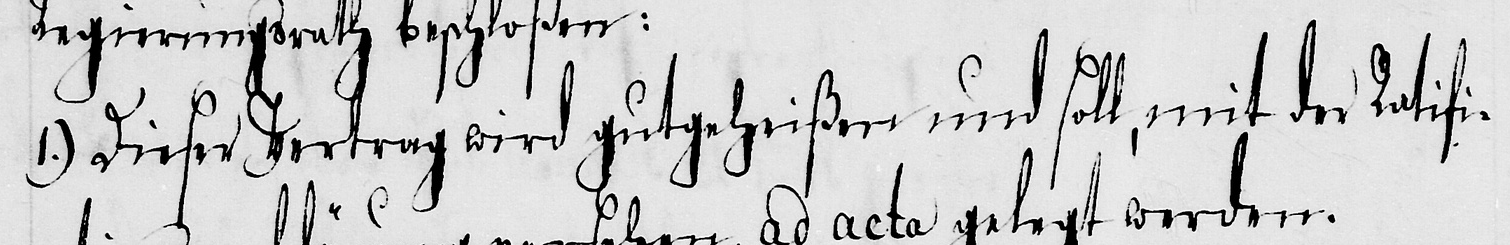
1.) Dieser Vertrag wird gutgeheißen und soll, mit der Ratif¬
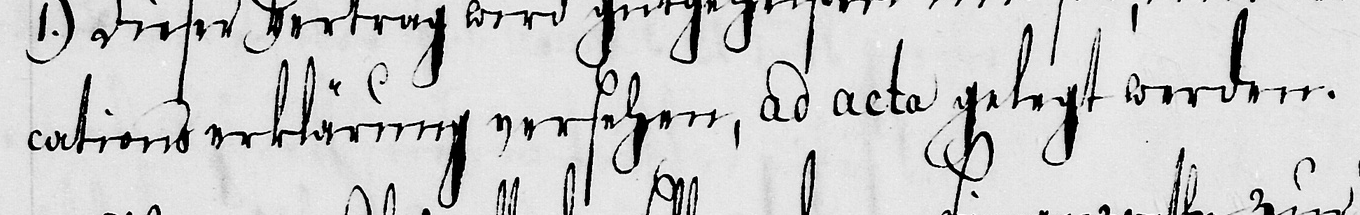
icationserklärung versehen, ad acta gelegt werden.
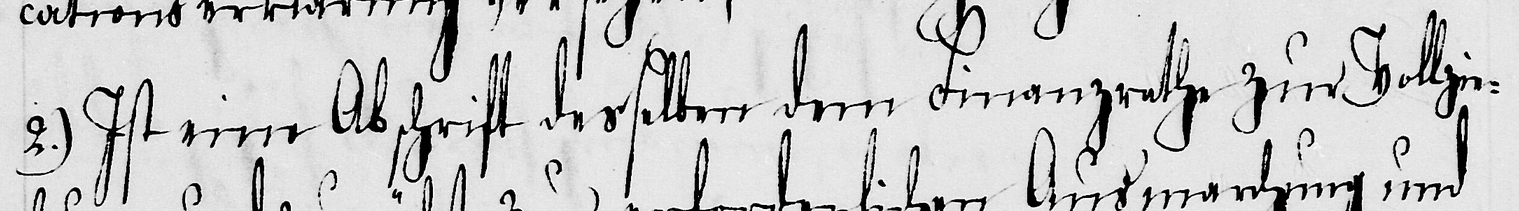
2.) Ist eine Abschrift desselben dem Finanzrathe zur Vollzi¬
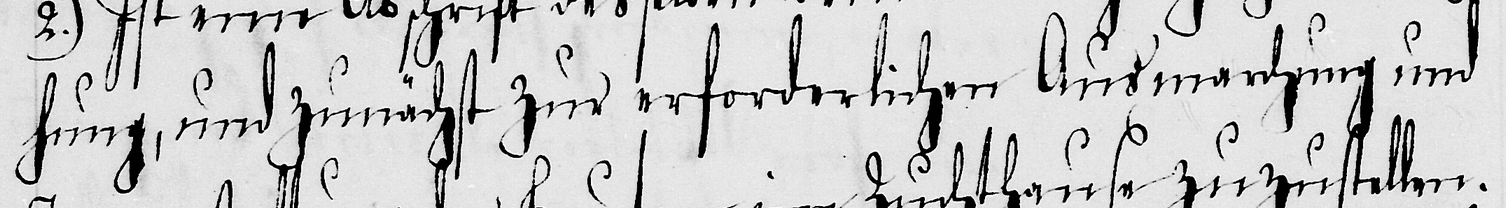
ehung, und zunächst zur erforderlichen Ausmarchung und
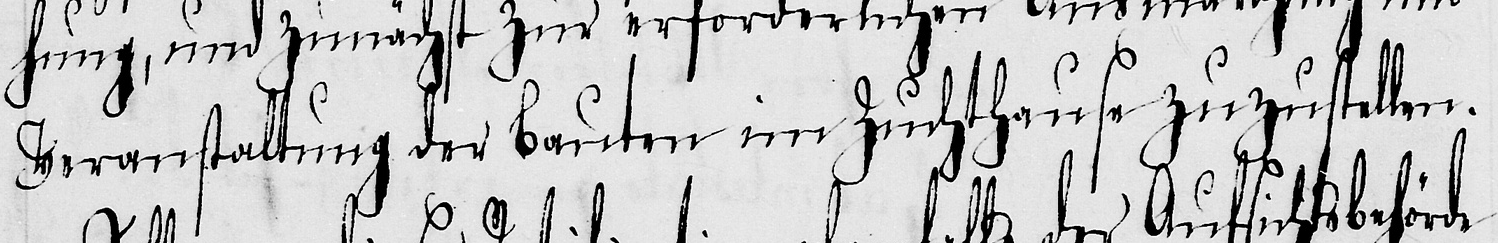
Veranstaltung der Bauten im Zuchthause zuzustellen.
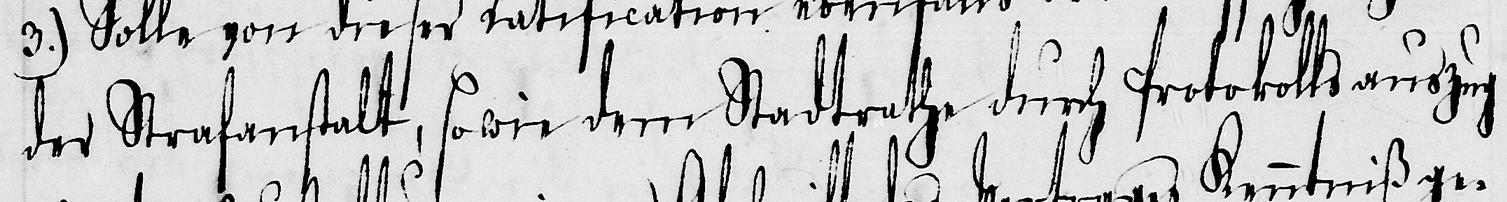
der Strafanstalt, sowie dem Stadtrathe durch Protokollsauszug
